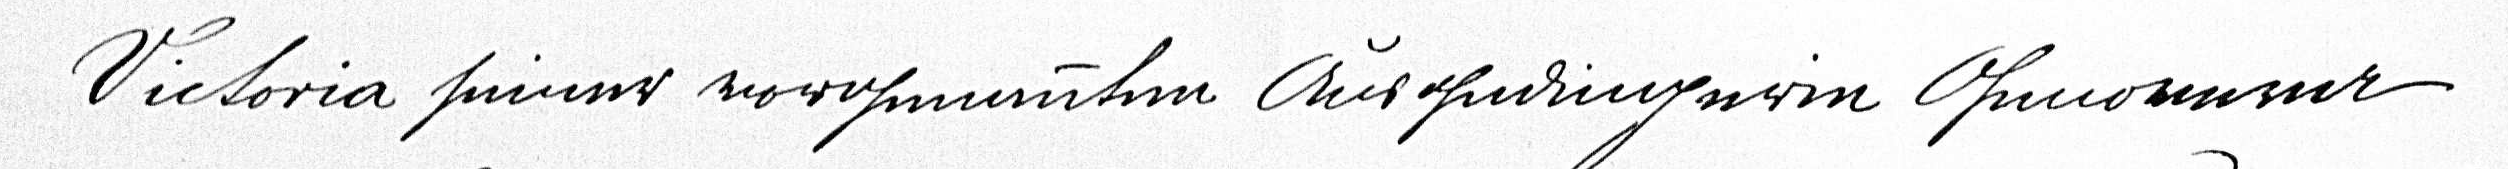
Victoria seiner vorgenannten Ausgedingerin Genoveva
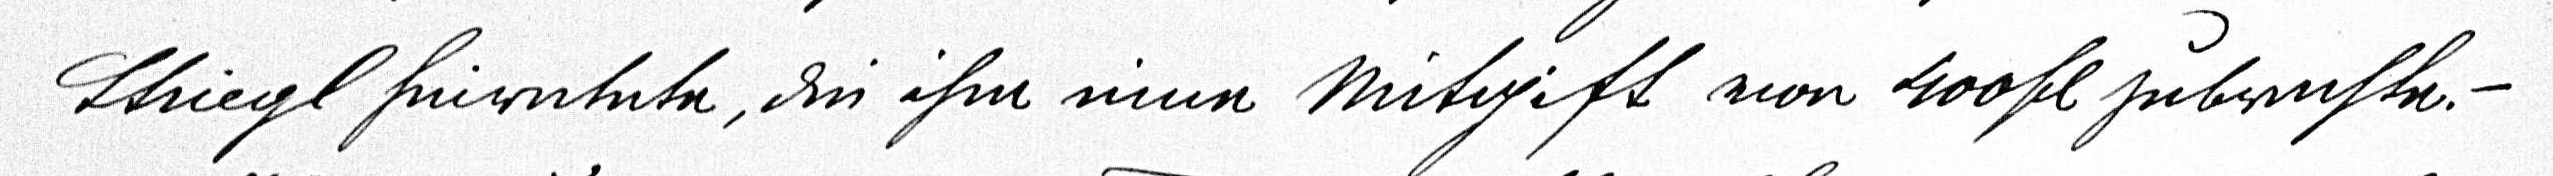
Striegl heiratete, die ihm eine Mitgift von 400 fl zubrachte.
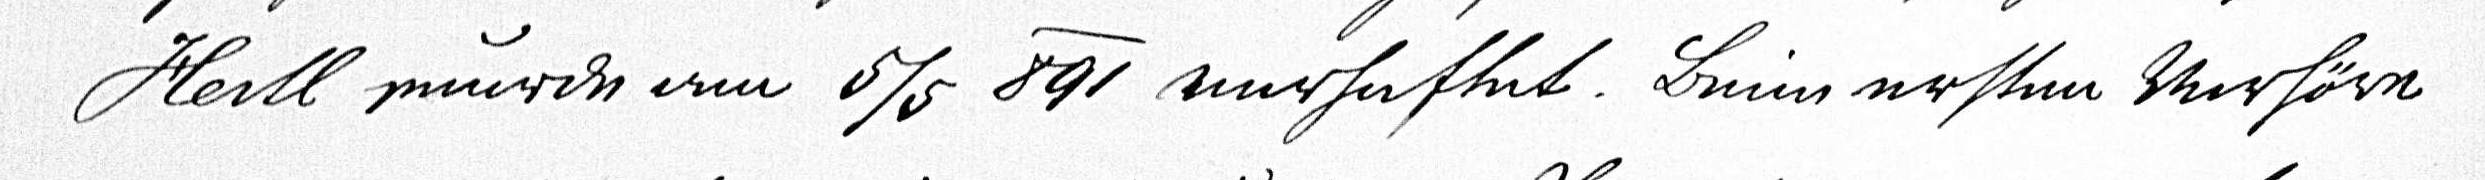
Hertl wurde am 5/5/1891 verhaftet. Beim ersten Verhöre
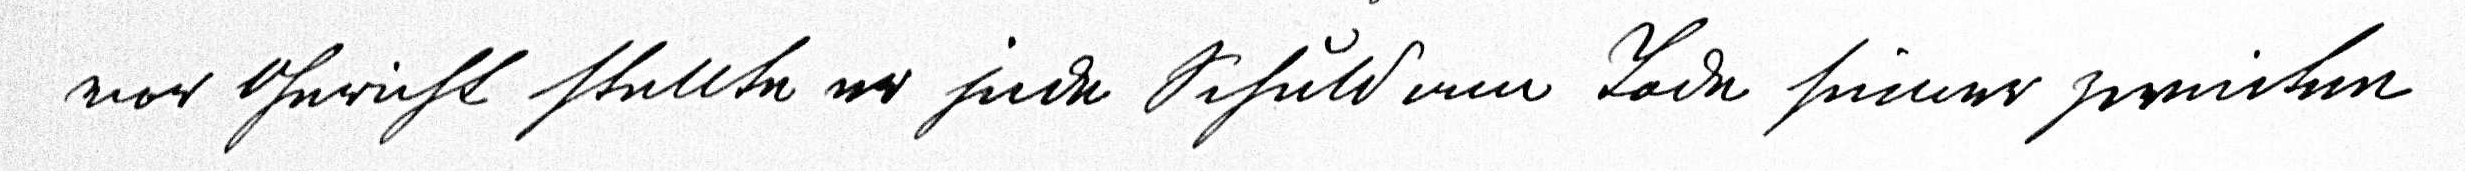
vor Gericht stellte er jede Schuld am Tode seiner zweiten
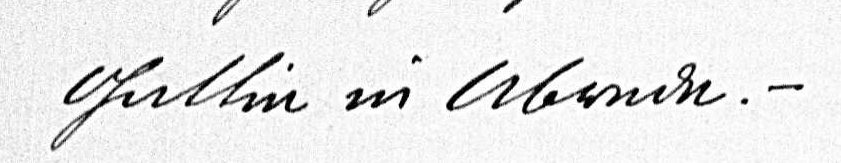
Gattin in Abrede. –
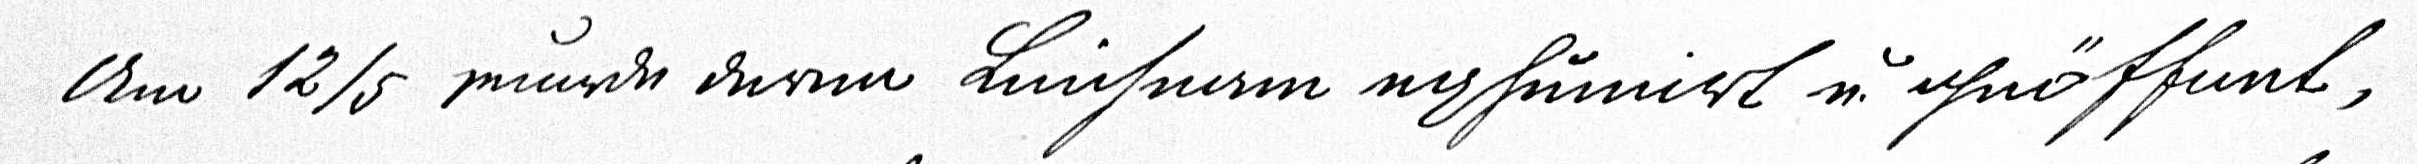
Am 12/5 wurde deren Leichnam exhumirt u. geöffnet,
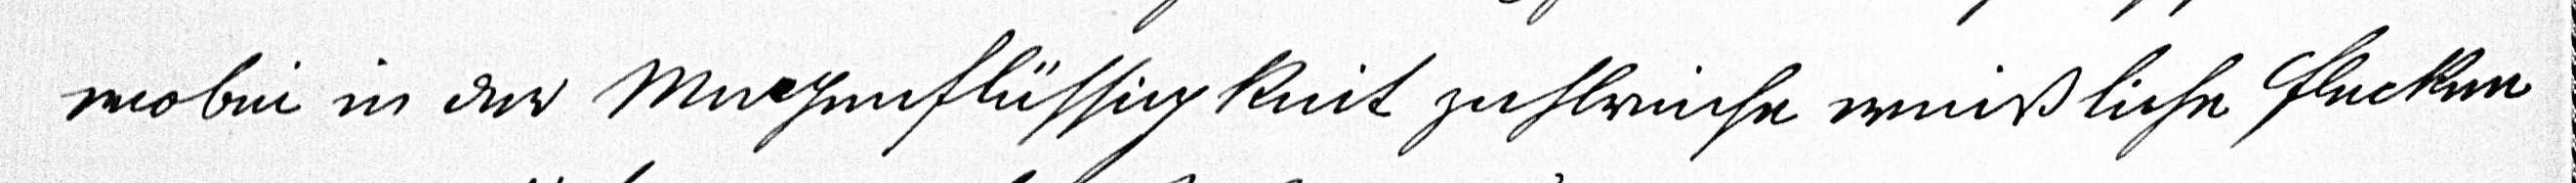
wobei in der Magenflüssigkeit zahlreiche weisliche Flecken
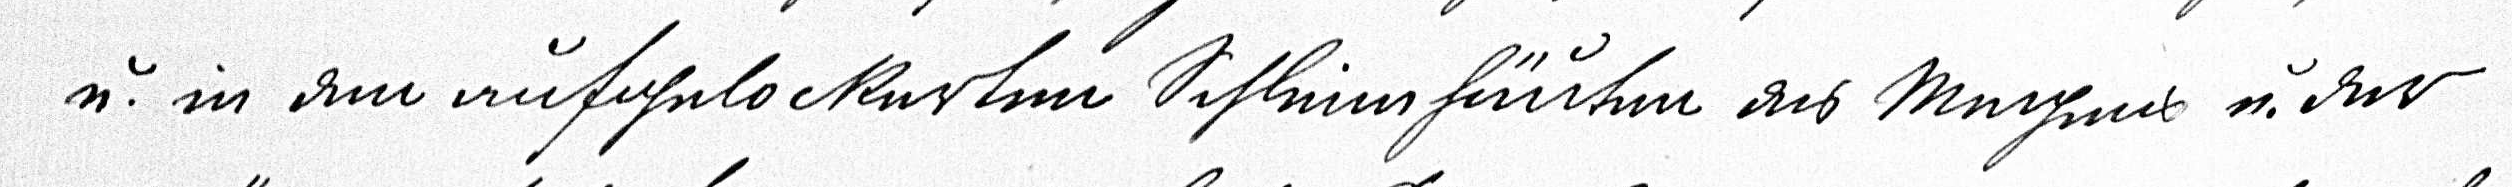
u. in den aufgelockertem Schleimhäuten des Magens u. der
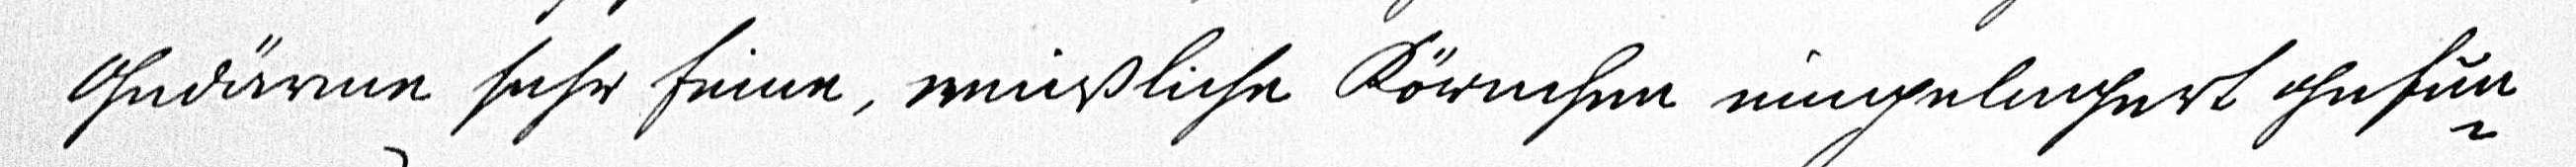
Gedärme sehr feine, weißliche Körnchen eingelagert gefun¬
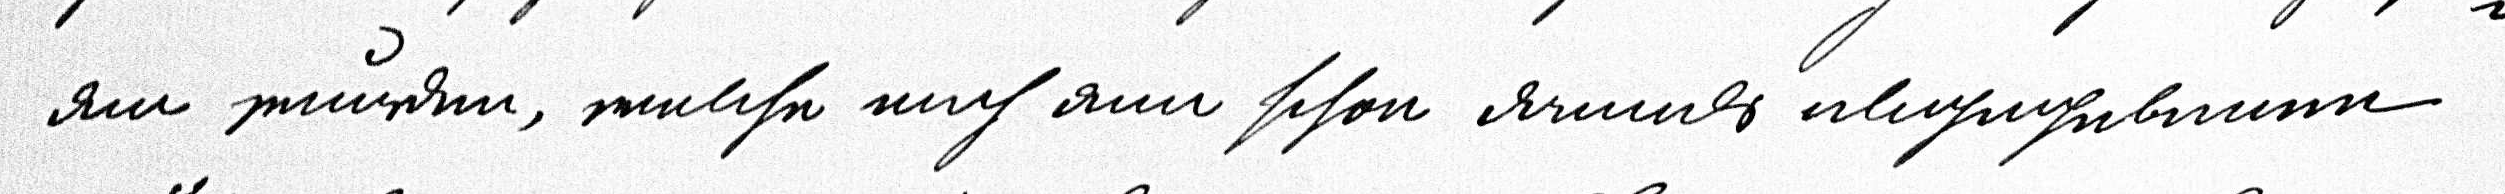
den wurden, welche nach dem schon damals abgegebenen
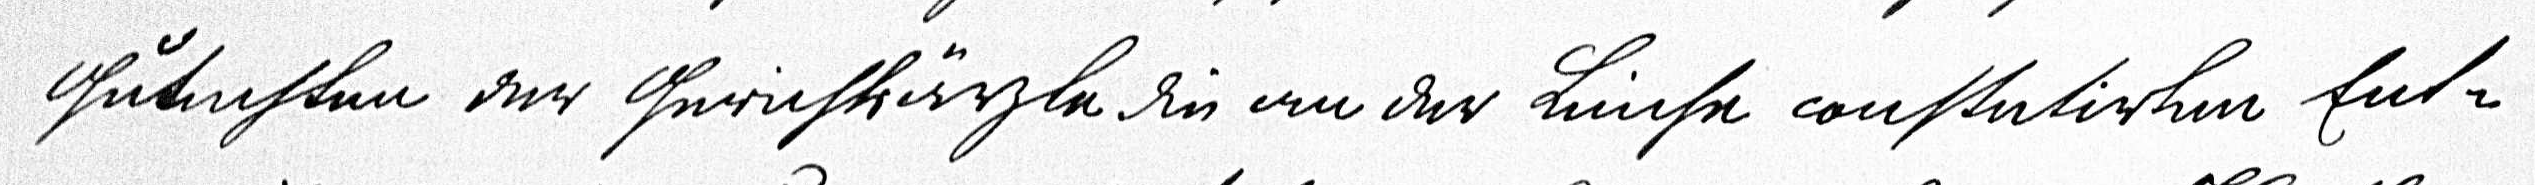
Gutachten der Gerichtärzte die an der Leiche constatirten Ent¬
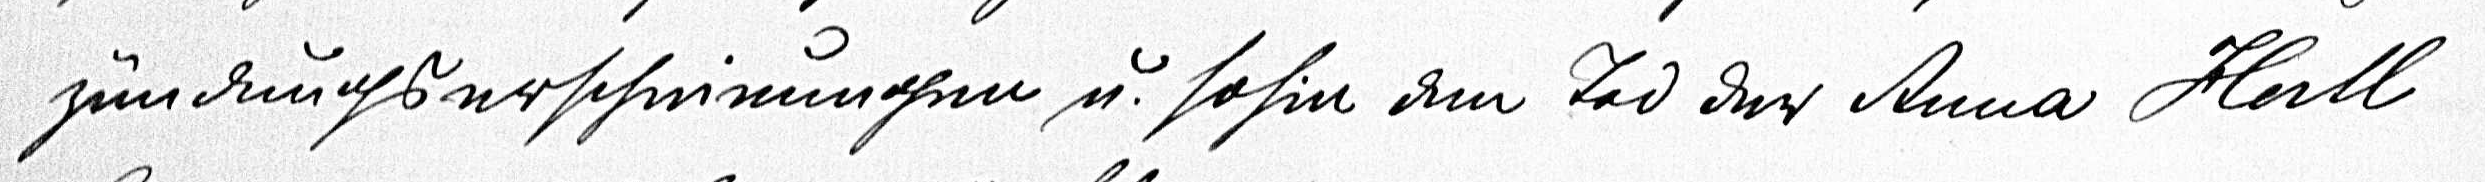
zückungserscheinungen u. sohin dem Tod der Anna Hertl
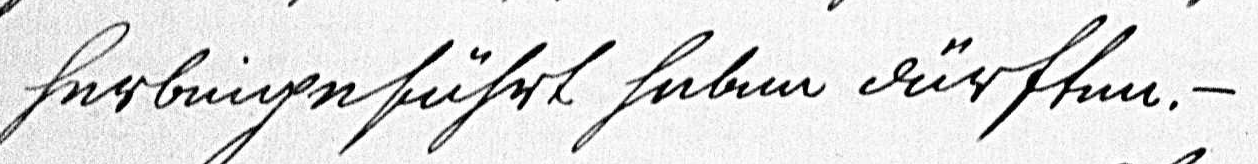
herbeigeführt haben dürften.
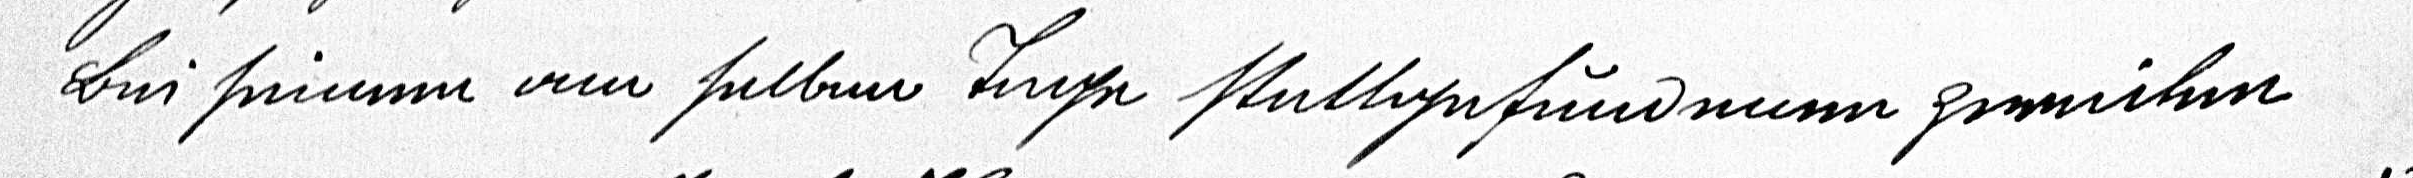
Bei seinem am selben Tage stattgefundenen zweiten
